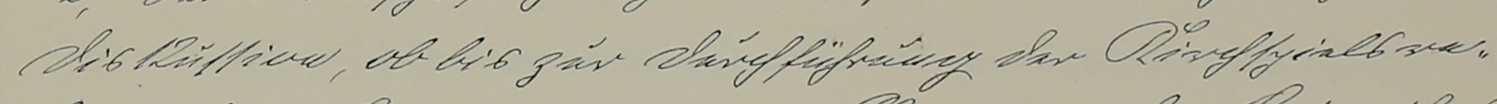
Diskussion, ob bis zur Durchführung der Kirchspielsre-
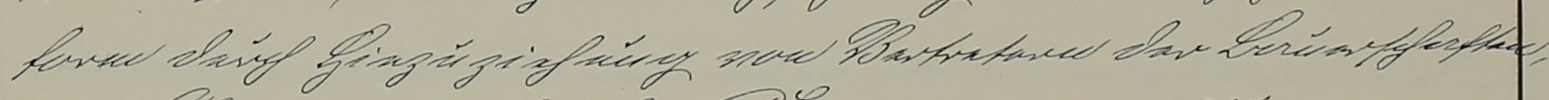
form durch Hinzuziehung von Vertretern der Bauerschaften,
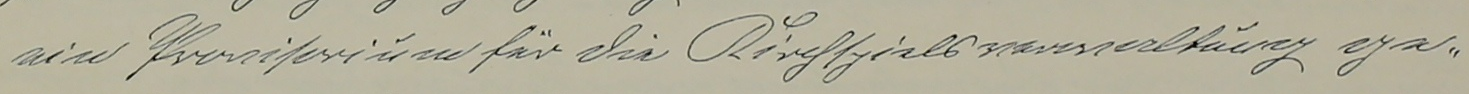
ein Provisorium für die Kirchspielsverwaltung ge-
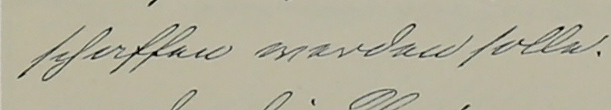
schaffen werden solle.
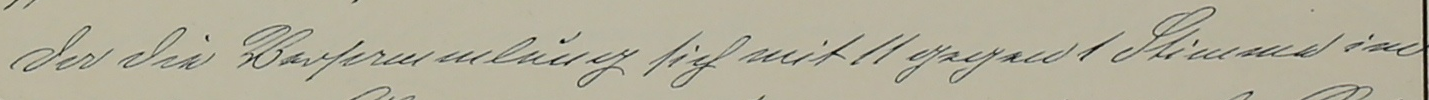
Da die Versammlung sich mit 11 gegen 1 Stimme im
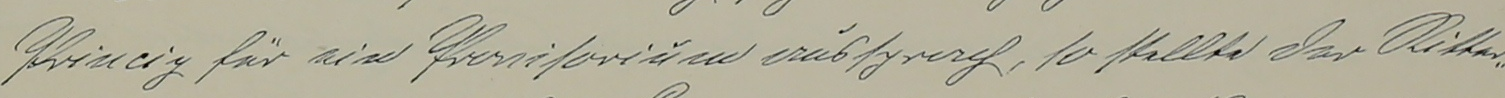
Princip für ein Provisorium aussprach, so stellte der Ritter-
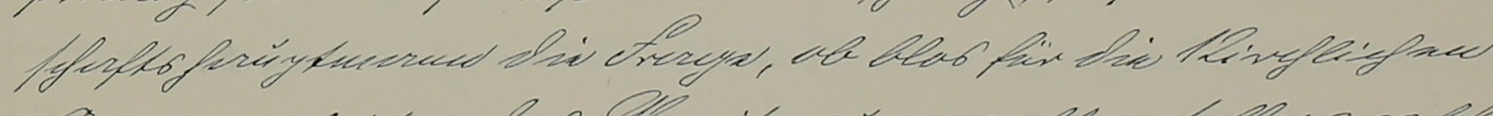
schaftshauptmann die Frage, ob blos für die kirchlichen
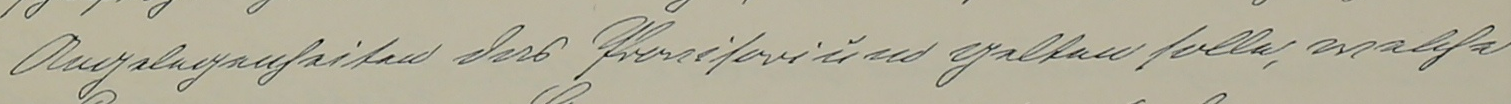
Angelegenheiten das Provisorium gelten solle, welche
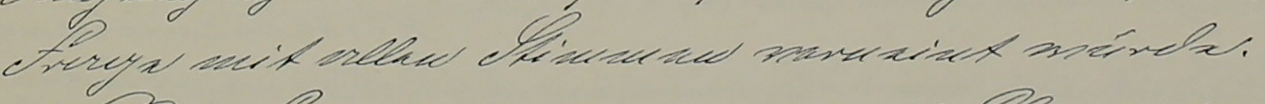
Frage mit allen Stimmen verneint wurde.
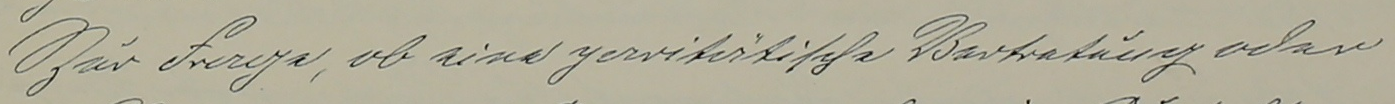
Zur Frage, ob eine paritätische Vertretung oder
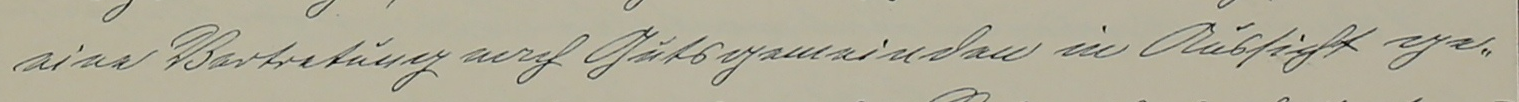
eine Vertretung nach Gutsgemeinden in Aussicht ge-
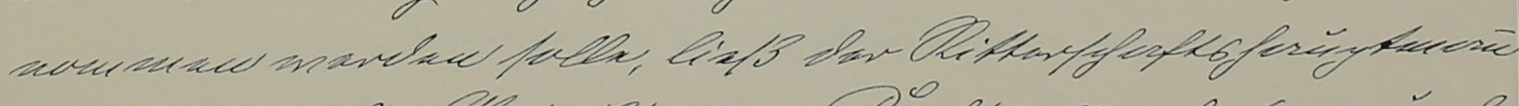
nommen werden solle, ließ der Ritterschaftshauptmann
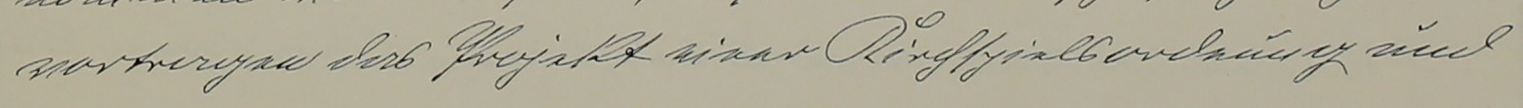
vortragen das Projekt einer Kirchspielsordnung und
